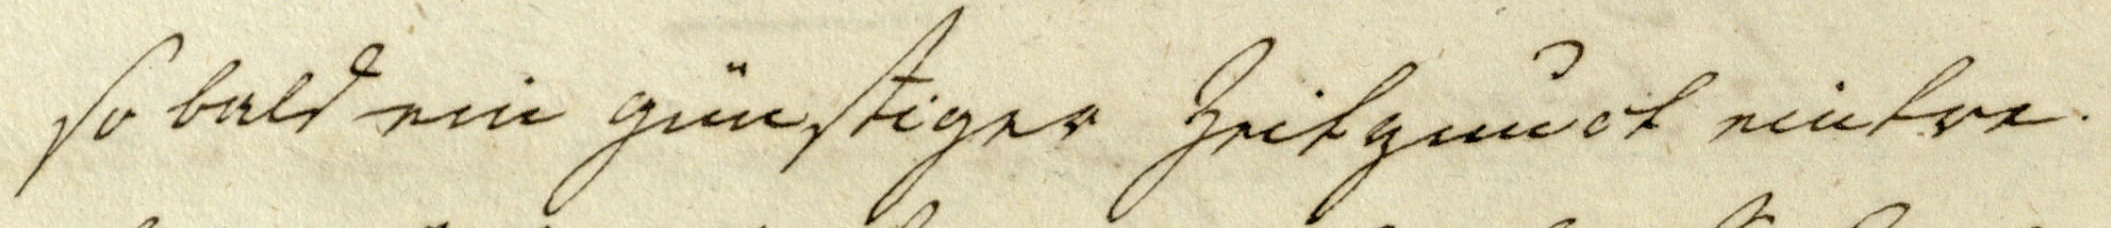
so bald ein günstiger Zeitpunct eintre¬
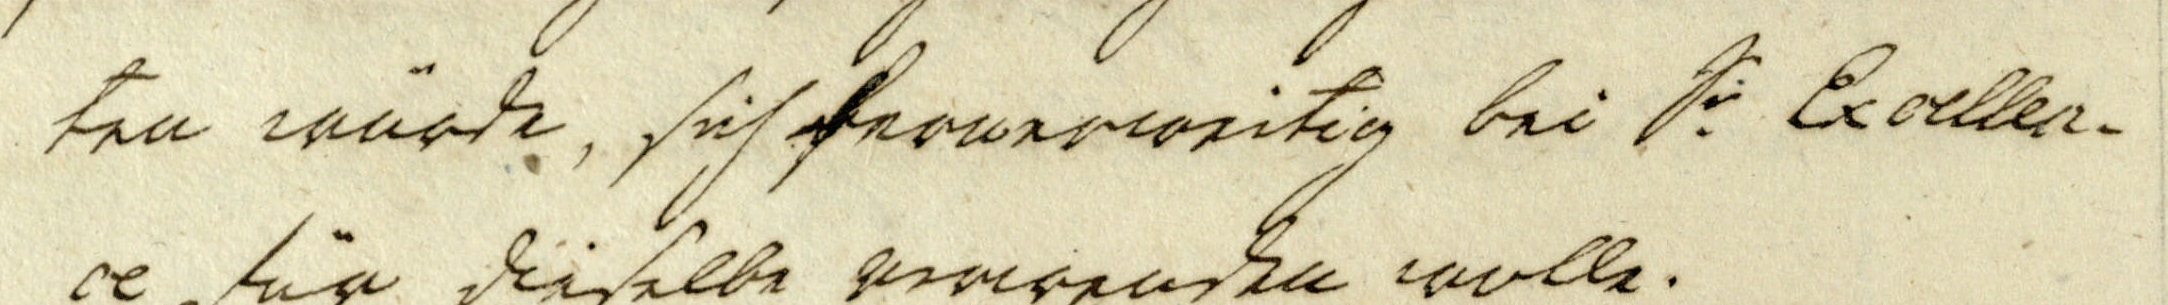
ten würde, sich fernerweitig bei Sr. Excellen¬
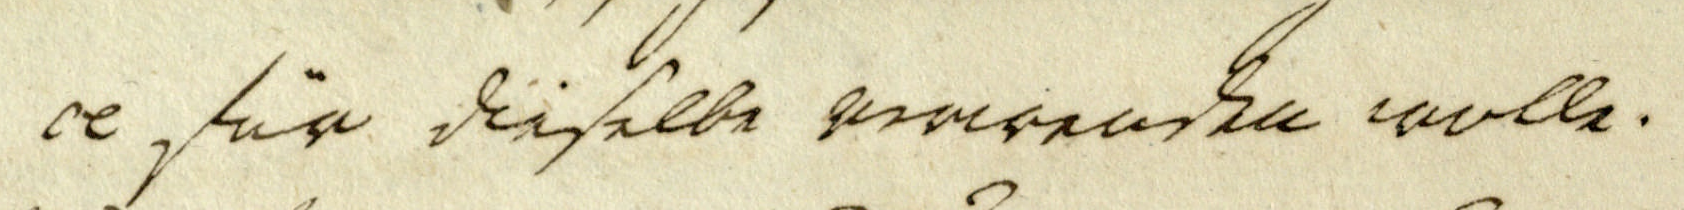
ce für dieselbe verwenden wolle.
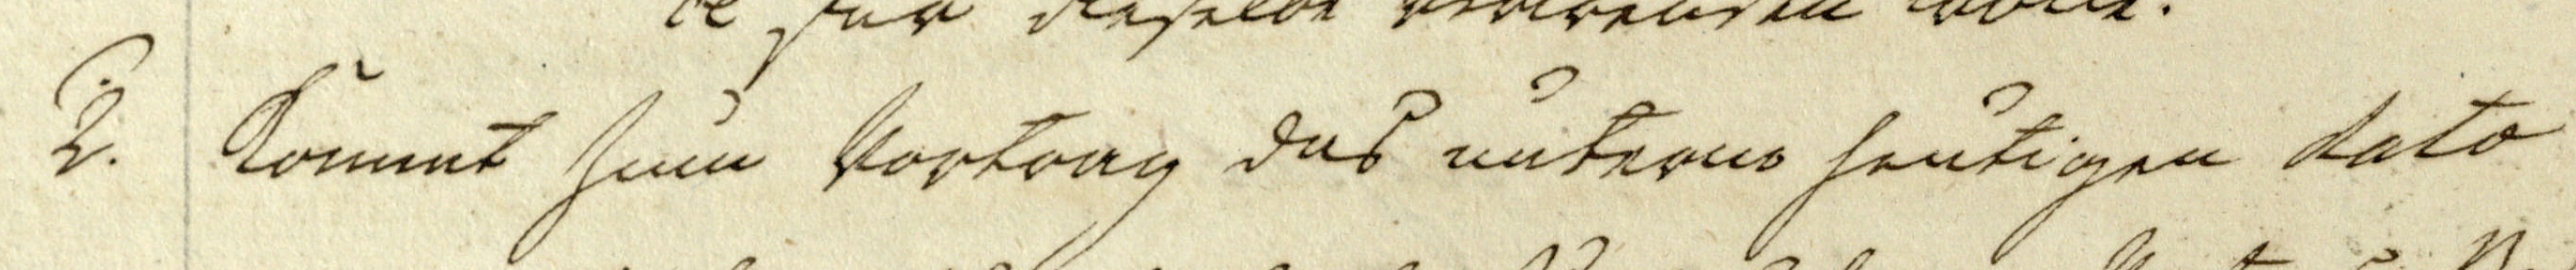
2. Kommt zum Vortrag das unterm heutigen dato
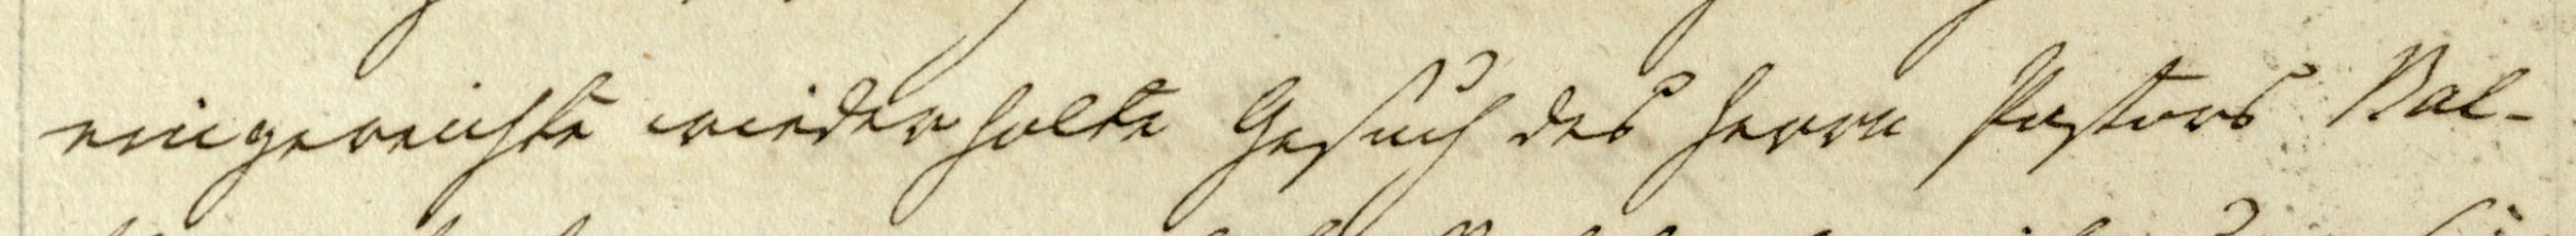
eingereichte wiederholte Gesuch des herrn Pastors Bal¬
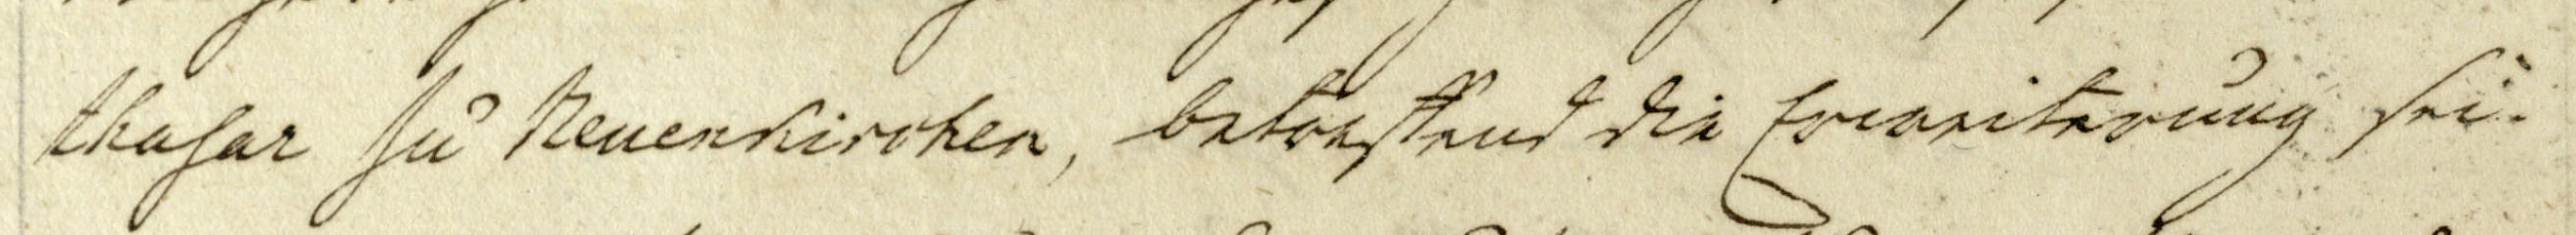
thasar zu Neuenkirchen, betreffend die Erweiterung sei¬
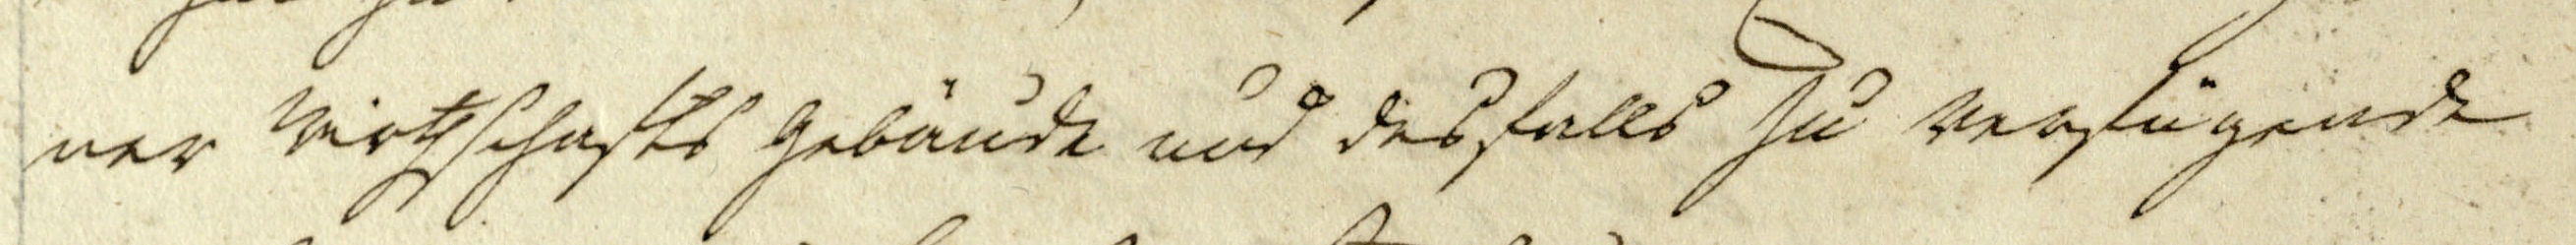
ner Wirthschafts Gebäude und desfalls zu verfügende
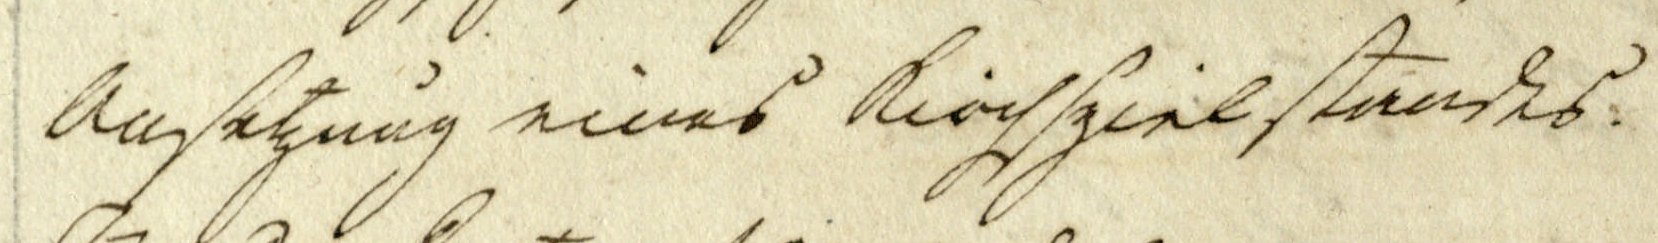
Ansetzung eines Kirchspielstandes.
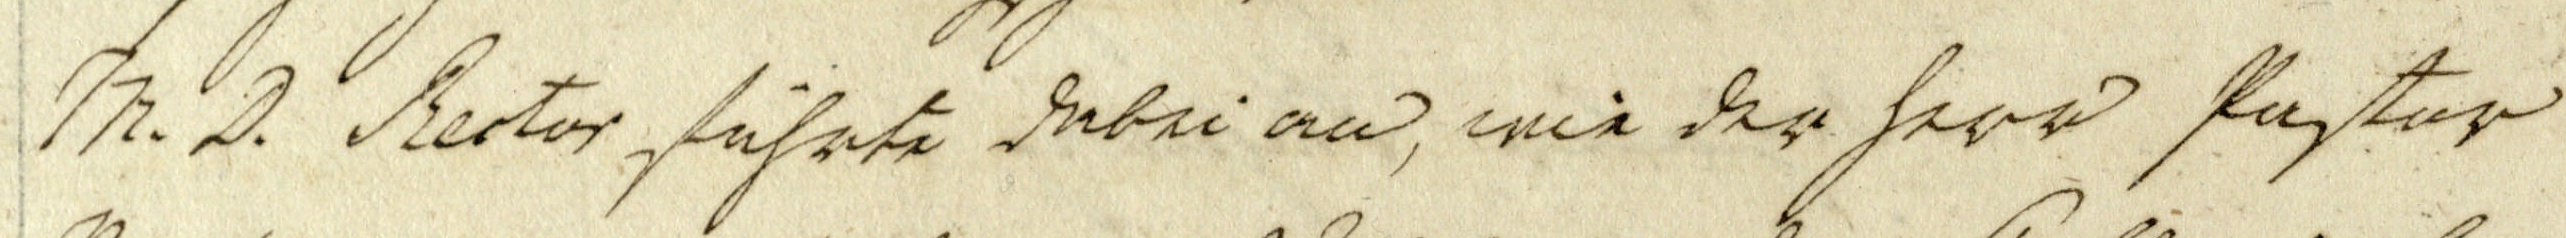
M. D. Rector führte dabei an, wie der herr pastor
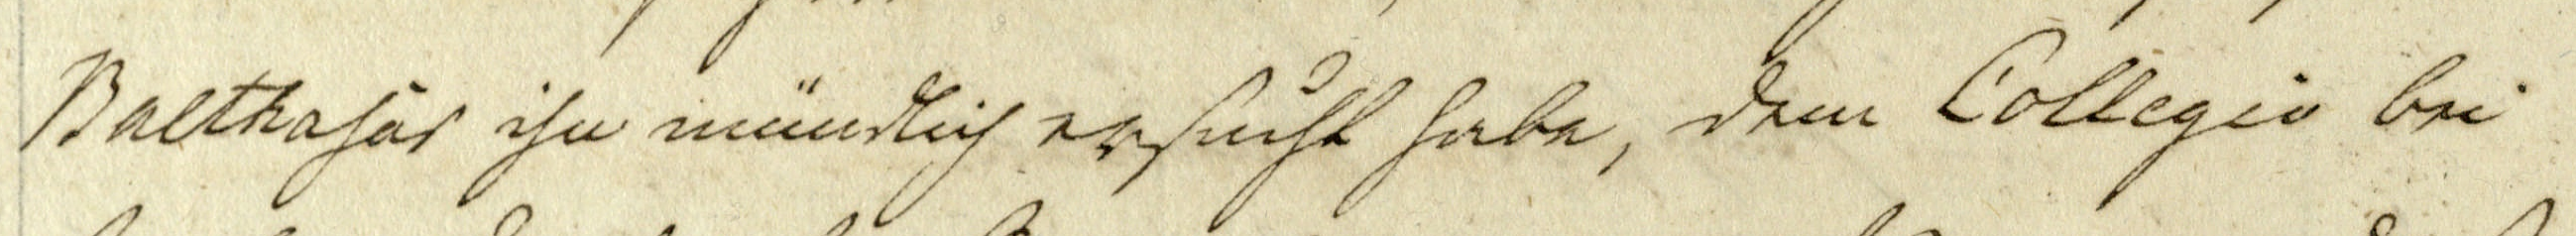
Balthasar ihn mündlich ersucht habe, dem Collegio bei
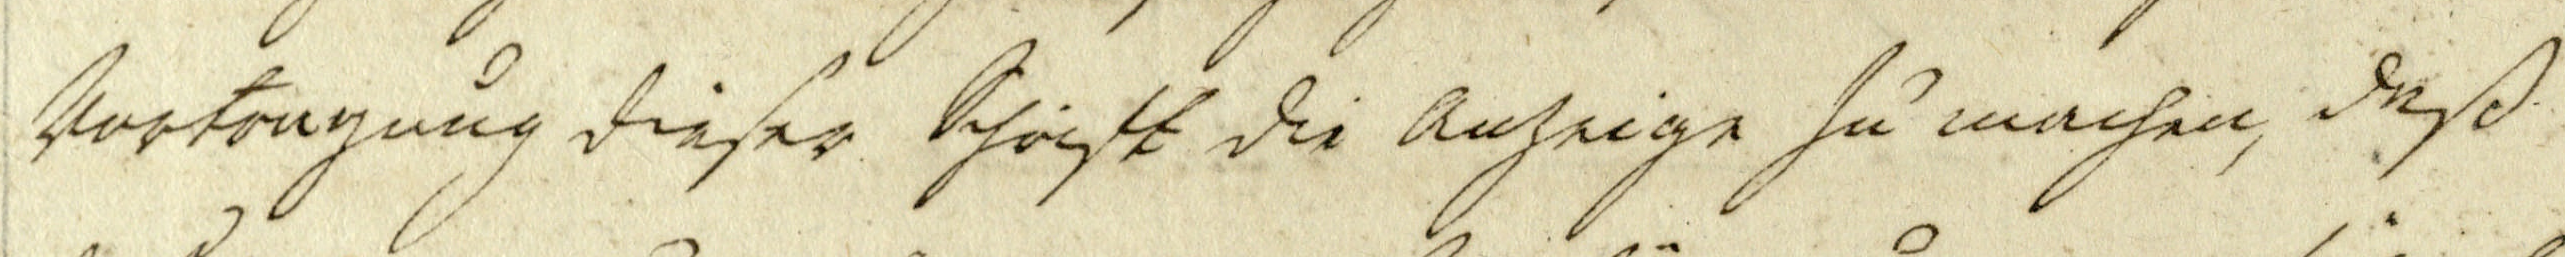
Vortragung dieser Schrift die Anzeige zu machen, daß
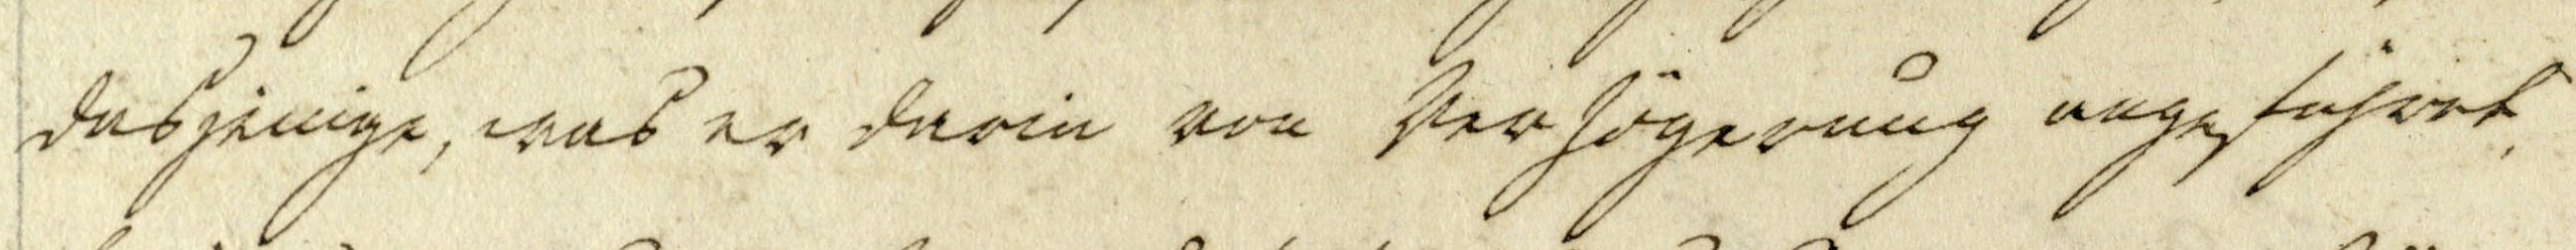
dasjenige, was er darin von Verzögerung angeführet,
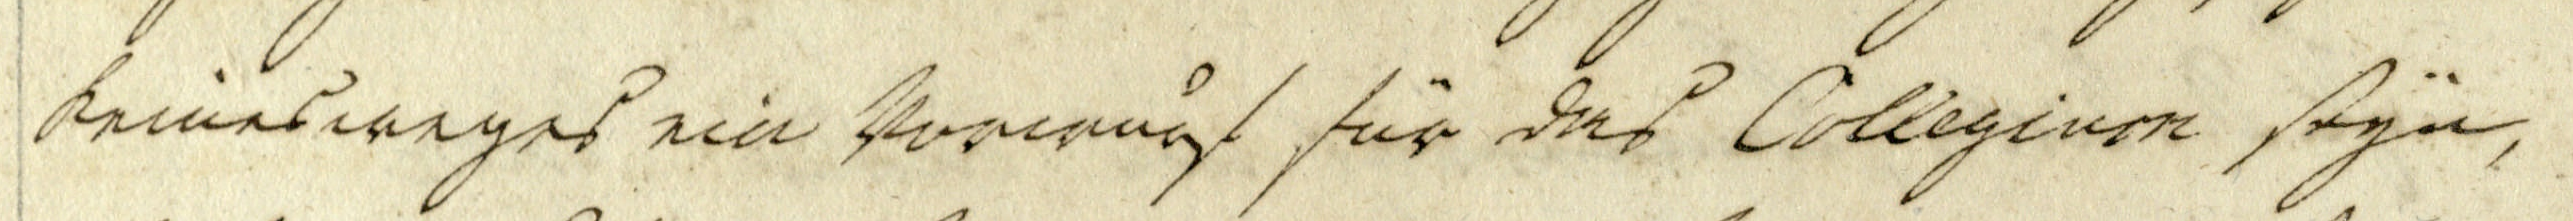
keinesweges ein Vorwurf für das Collegium seÿn,
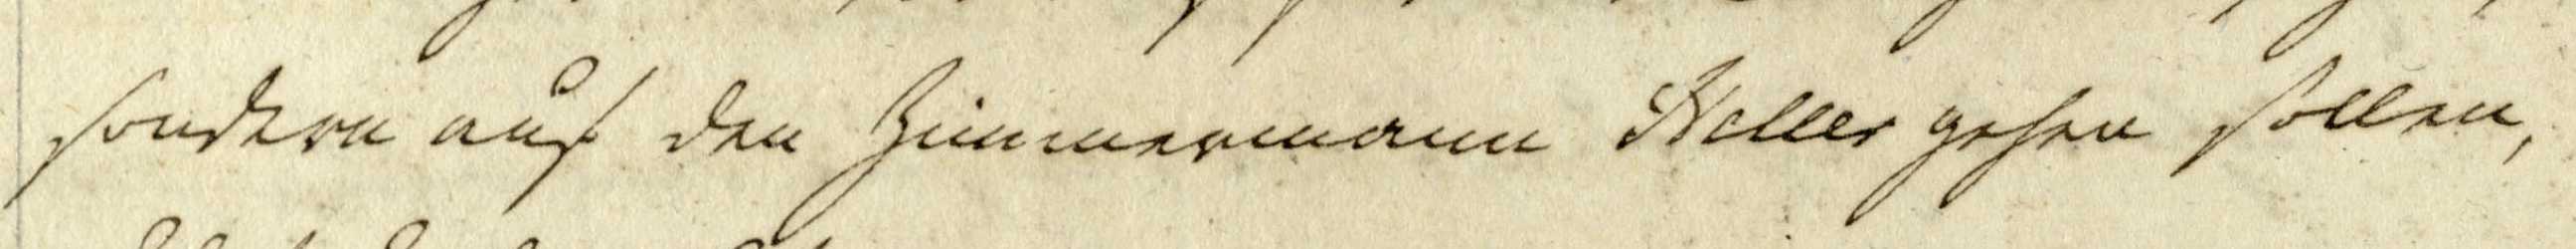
sondern auf den Zimmermann Heller gehen sollen,
